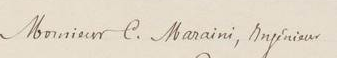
Monsieur C. Maraini, Ingénieur
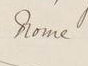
Rome
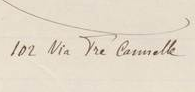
102 Via Tre Cannelle
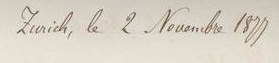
Zurich, le 2 Novembre 1877
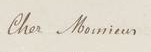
Cher Monsieur
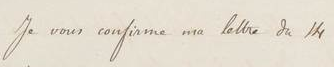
Je vous confirme ma lettre du 14
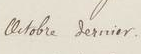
Octobre dernier.
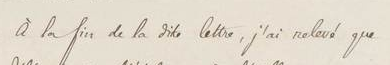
À la fin de la dite lettre, j'ai relevé que
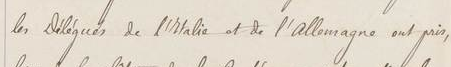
les Délégués de l'Italie et de l'Allemagne ont pris,
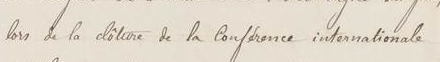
lors de la clôture de la Conférence internationale
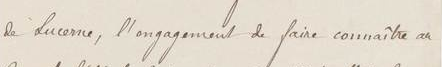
de Lucerne, l'engagement de faire connaître au
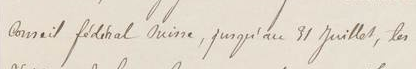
Conseil fédéral Suisse, jusqu'au 31 Juillet, les
